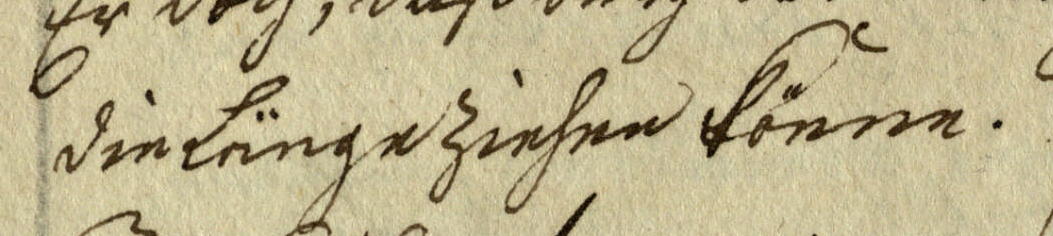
die Länge ziehen könne.
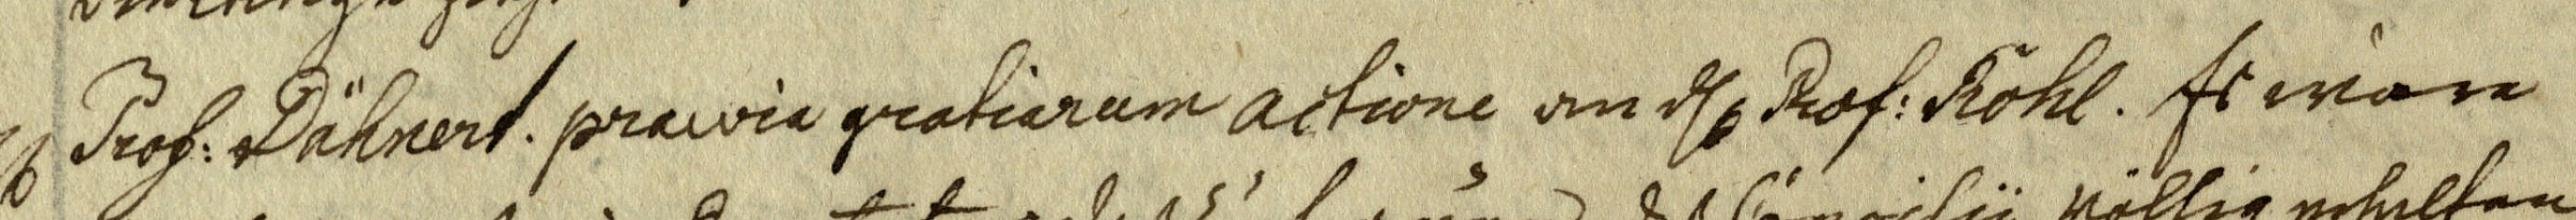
dh Prof. Dähnert praevia gratiarum actione an dh. Prof. Röhl. Es wäre
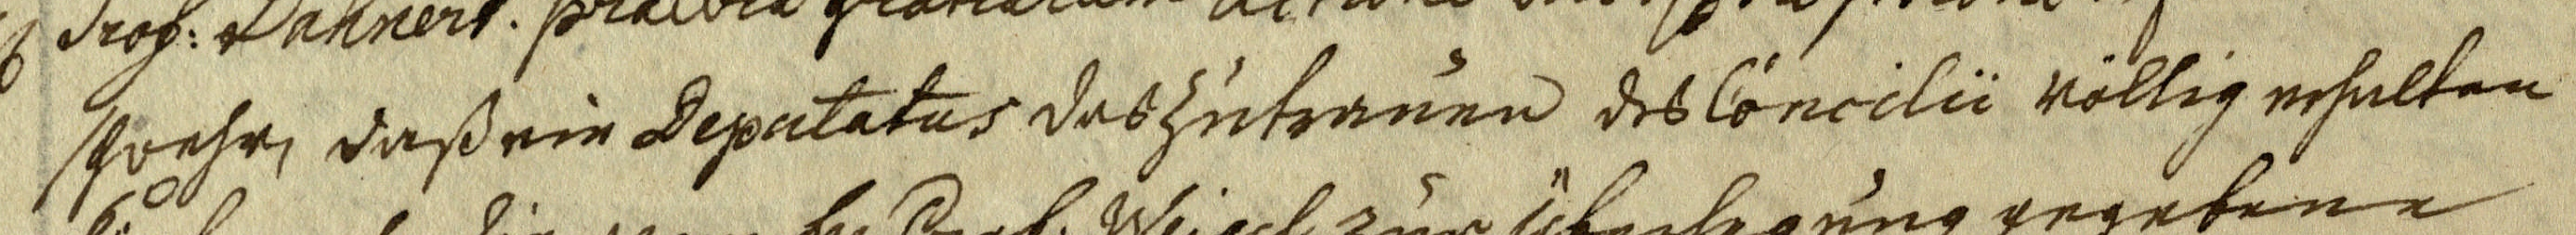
schwehr, daß ein Deputatus das Zutrauen des Concilii völlig erhalten
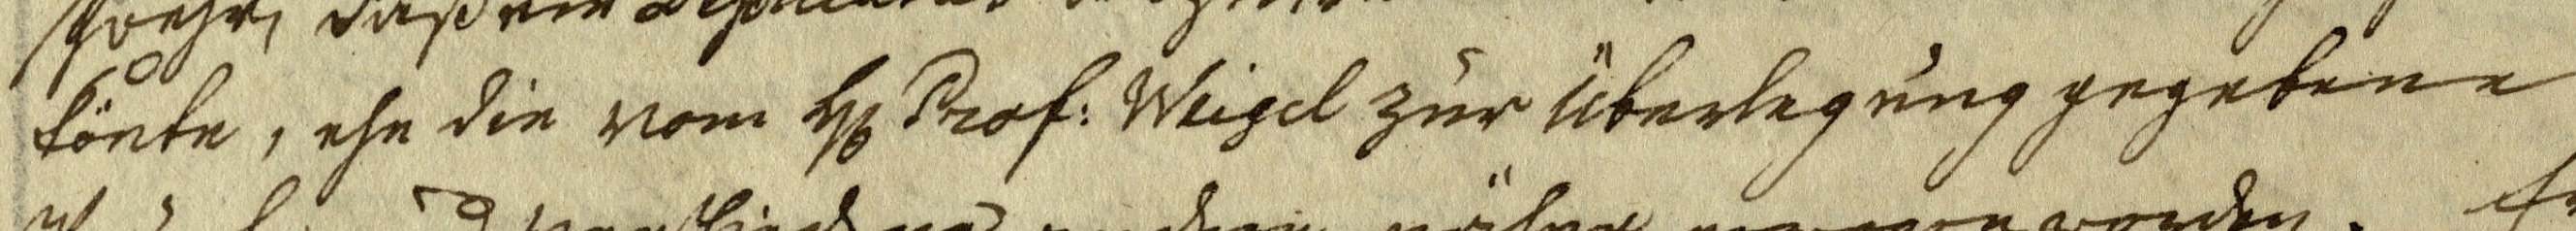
könte, ihn die vom H. Prof. Weigel zur Überlegung gegebenen
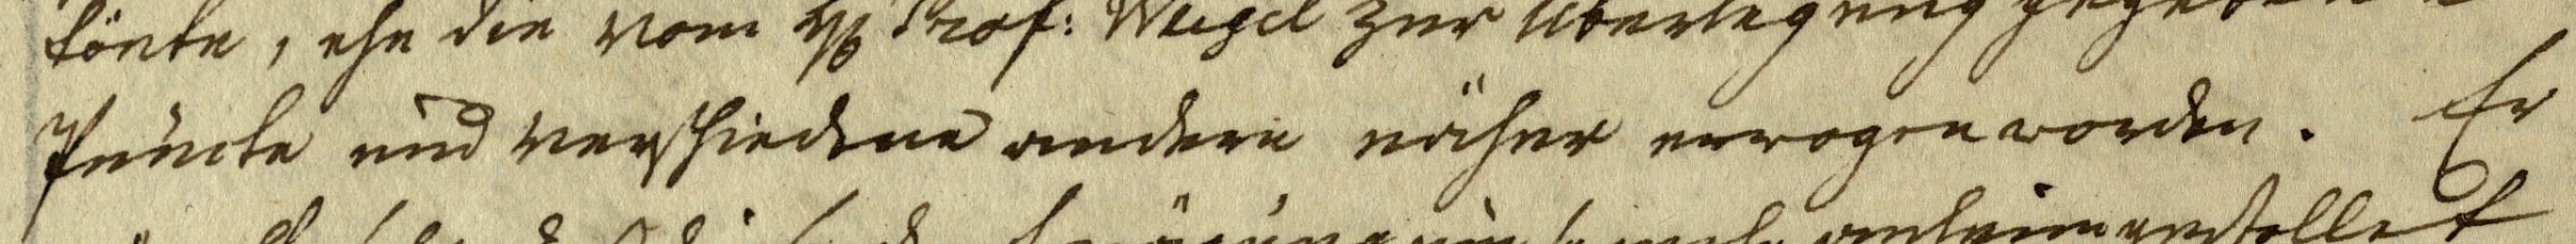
Puncte und verschiedene andere näher erwogen worden. Er
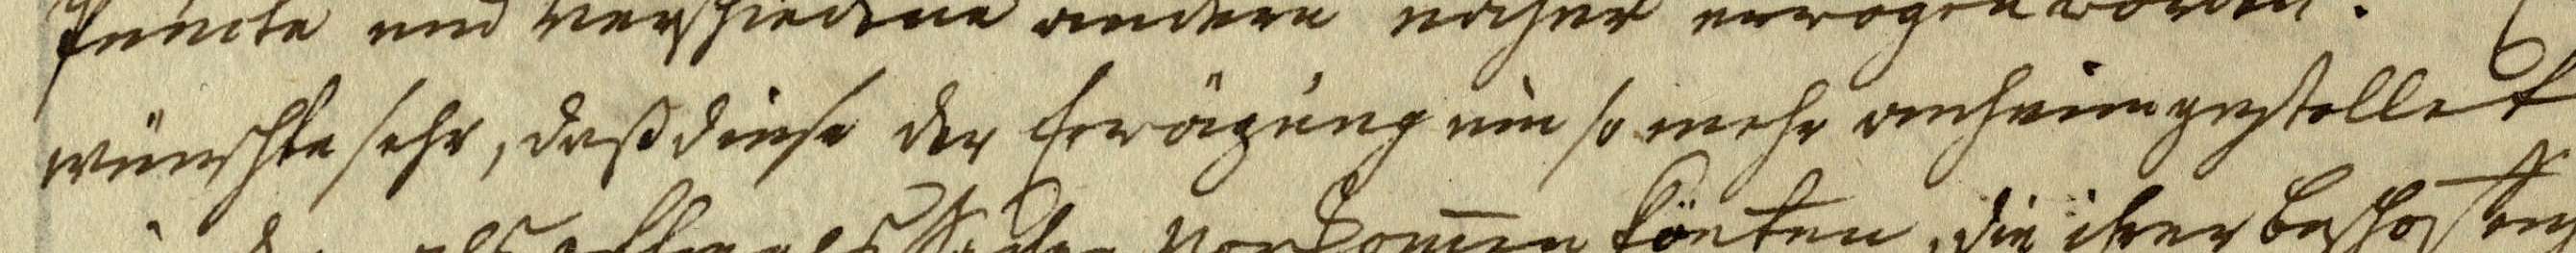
wünschte sehr, daß diese der Erwägung einum so mehr anheim gestellet
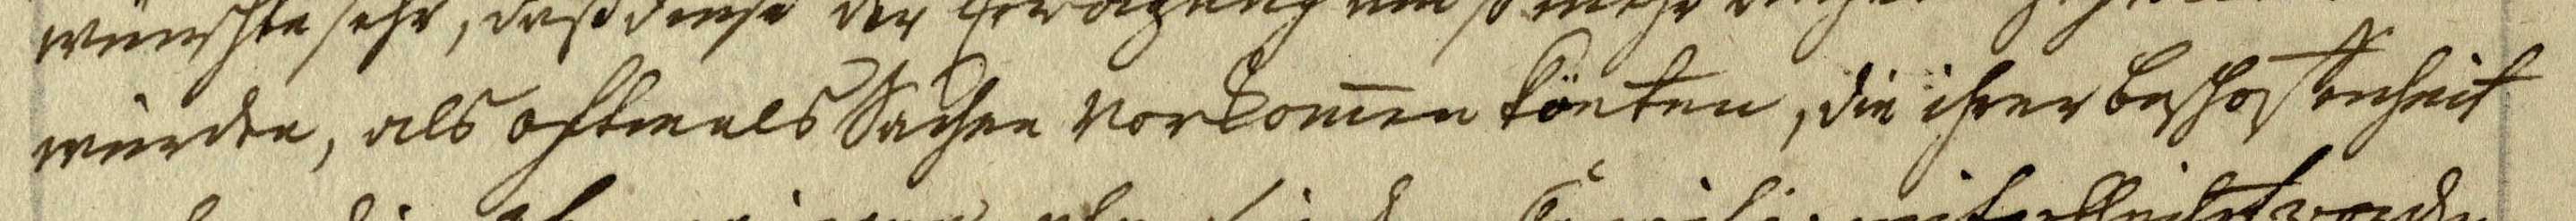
werden, als oftmals Sachen vorkommen könnten, die ihrer Beschaffenheit
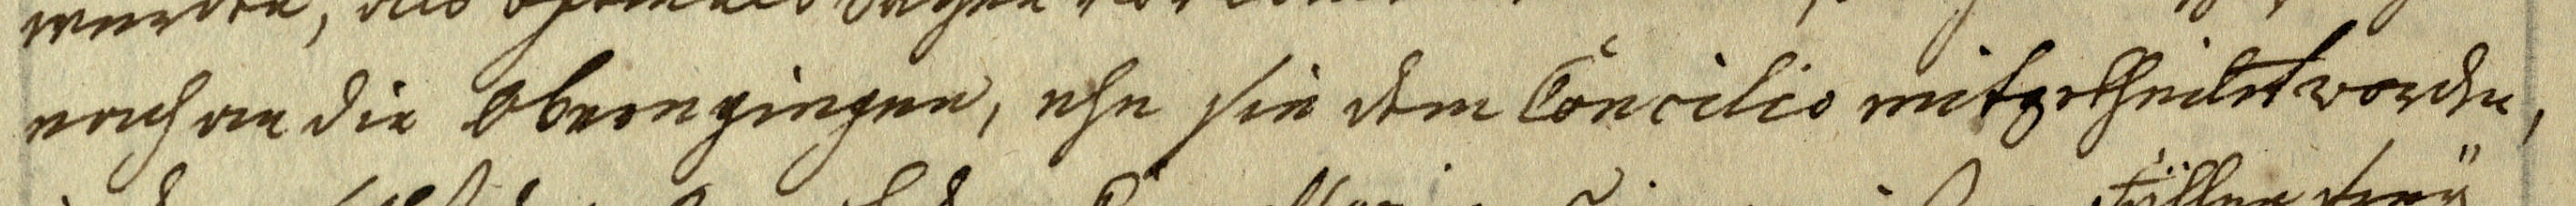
nach an die Obern gingen, ehe sie dem Concilio mitgetheilet worden,
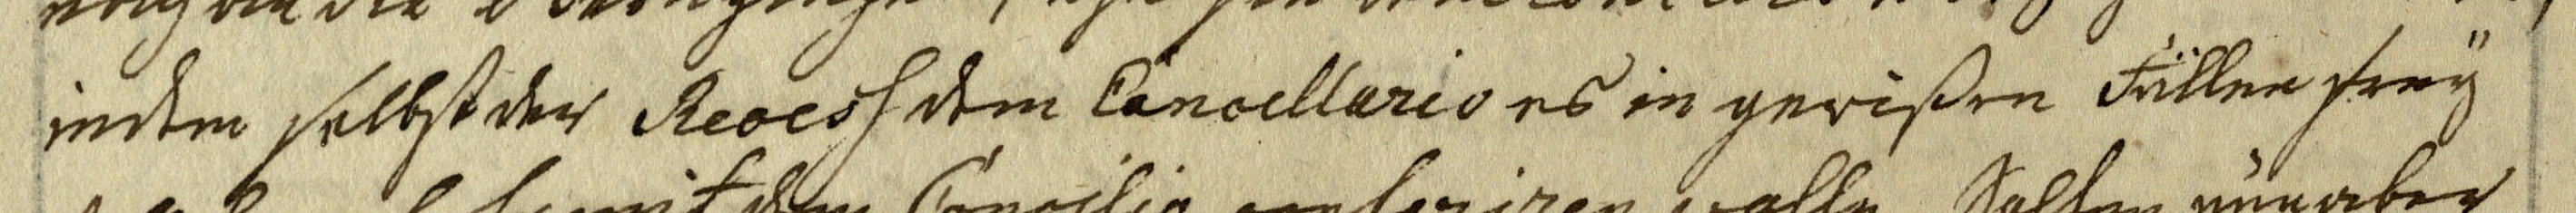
indem selbst der Recess dem Cancellario es in gewißen Fällen freÿ
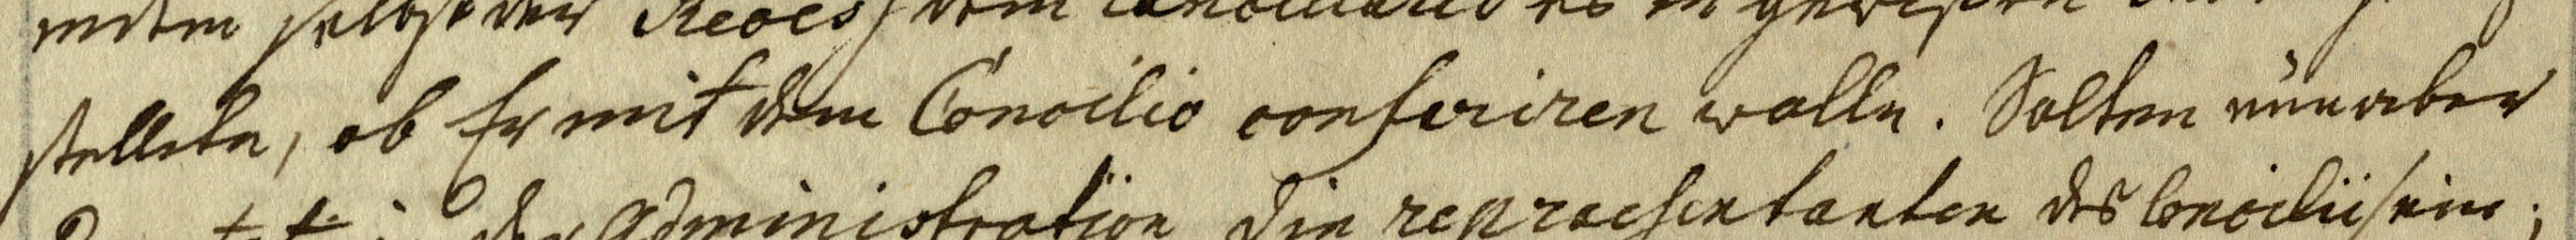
stellete, ob Er mit dem Concilio conferiren wolle. Solten nun aber
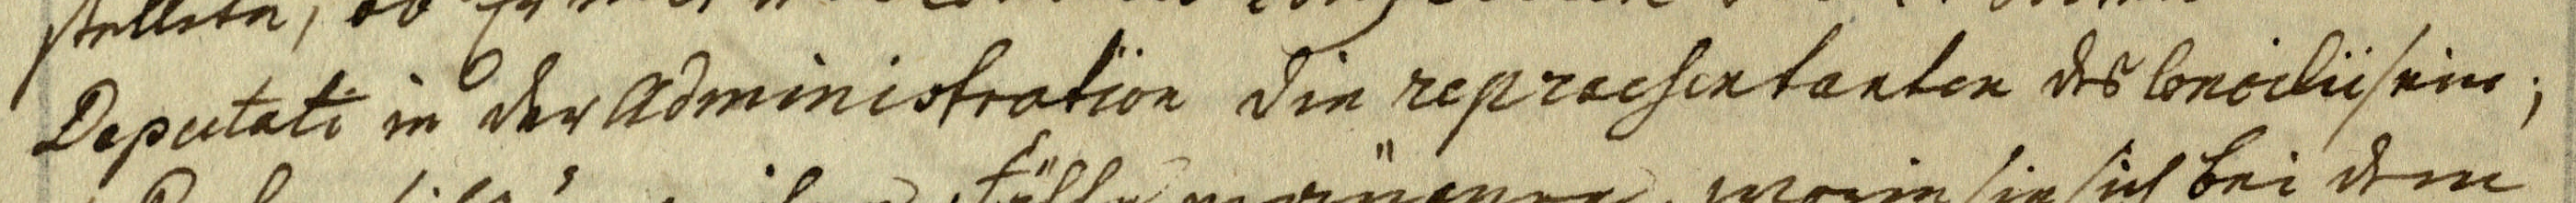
Deputati in der Administration die repraesentanten des Concilii sein,
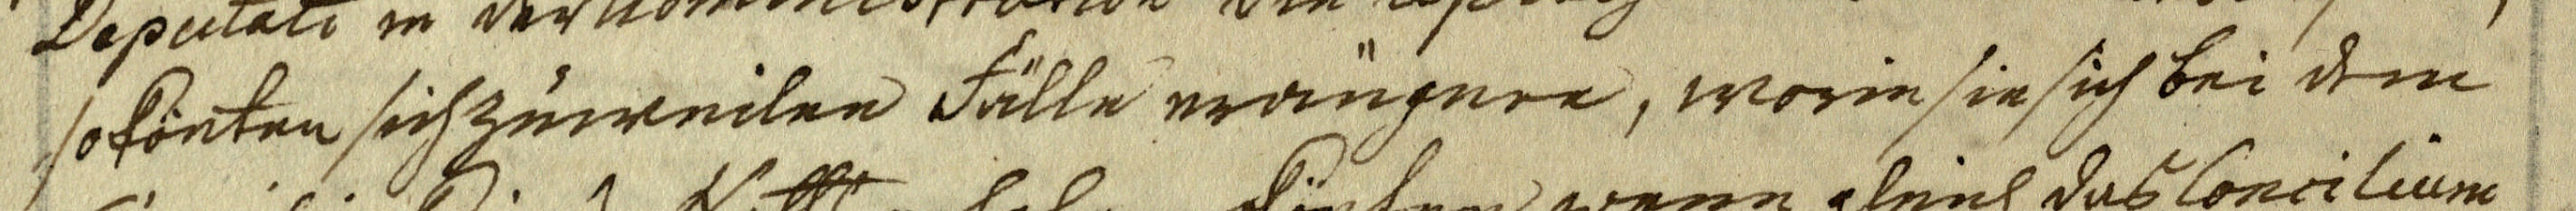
so könnten sich zuweilen Fälle eräugnen, worin in sich bei dem
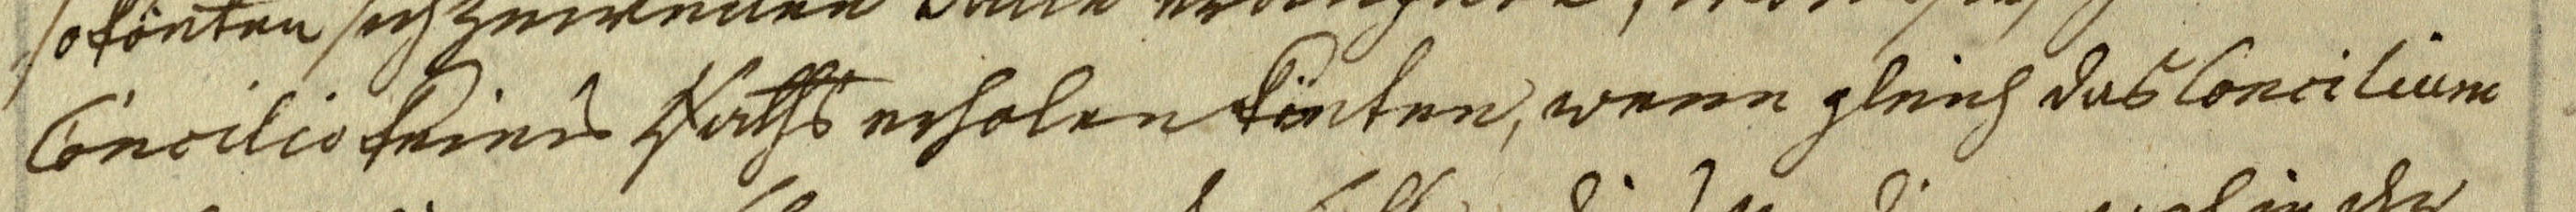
Concilio keines Raths erholen könten, wenn gleich das Concilium
